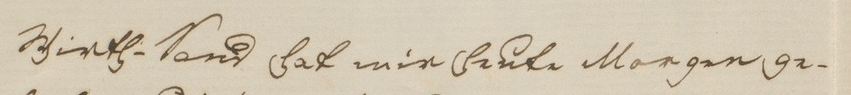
Wirth-Sand hat mir heute Morgen ge-
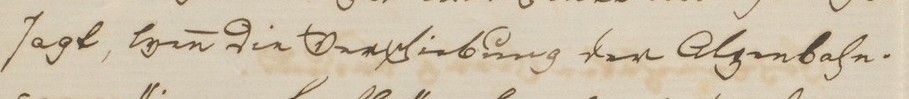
sagt, wenn die Verschiebung der Alpenbahn-
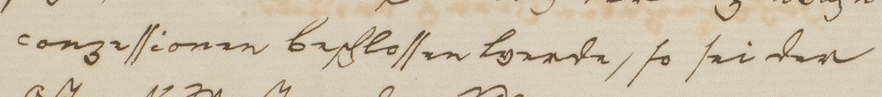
conzessionen beschlossen werde, so sei der
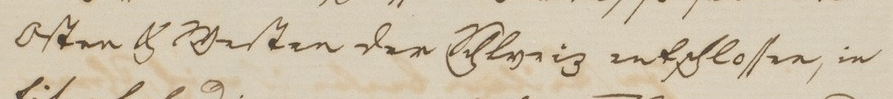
Osten & Westen der Schweiz entschlossen, in
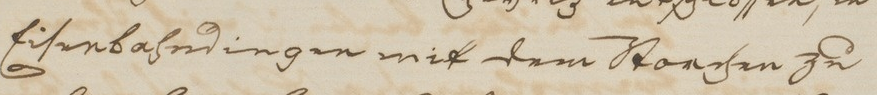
Eisenbahndingen mit dem Storchen zu
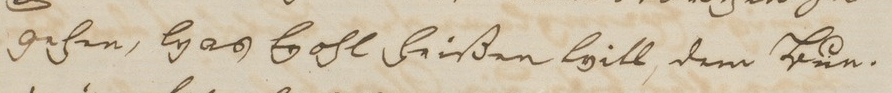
gehen, was wohl heißen will, dem Bun-
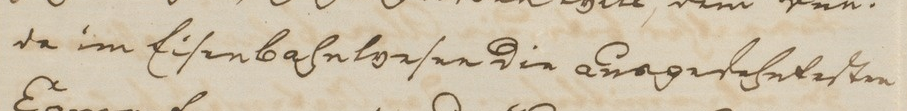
de im Eisenbahnwesen die ausgedehntesten
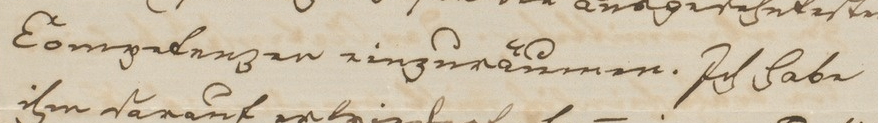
Competenzen einzuräumen. Ich habe
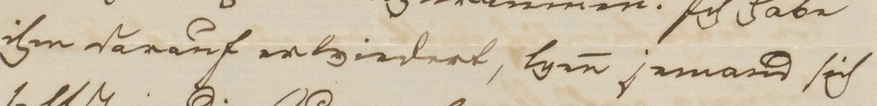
ihm darauf erwiedert, wenn jemand sich
